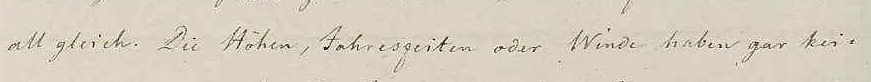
all gleich. Die Höhen, Jahreszeiten oder Winde haben gar kei-
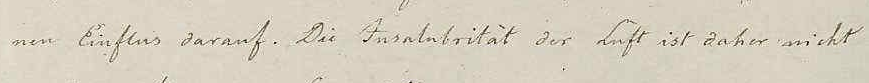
nen Einflus darauf. Die Insalubrität der Luft ist daher nicht
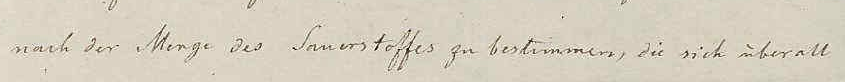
nach der Menge des Sauerstoffes zu bestimmen, die sich überall
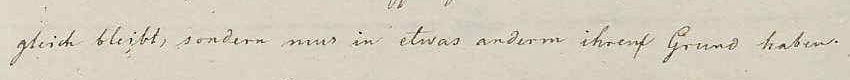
gleich bleibt, sondern mus in etwas anderm ihremn Grund haben.
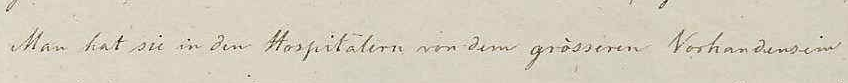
Man hat sie in den Hospitälern von dem grösseren Vorhandensein
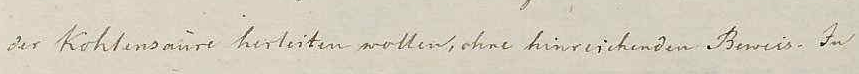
der Kohlensäure herleiten wollen, ohne hinreichenden Beweis. In
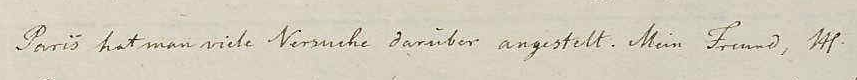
Paris hat man viele Versuche darüber angestelt. Mein Freund, H￼.
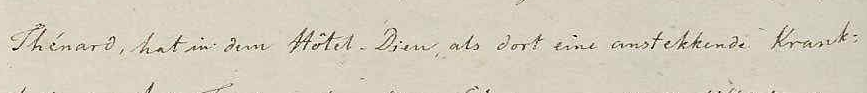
Thénard, hat in dem Hôtel-Dieu, als dort eine anstekkende Krank-
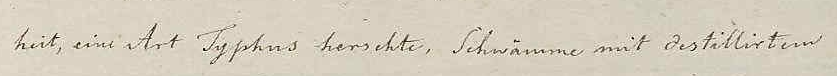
heit, eine Art Typhus herschte, Schwämme mit destillirtem
